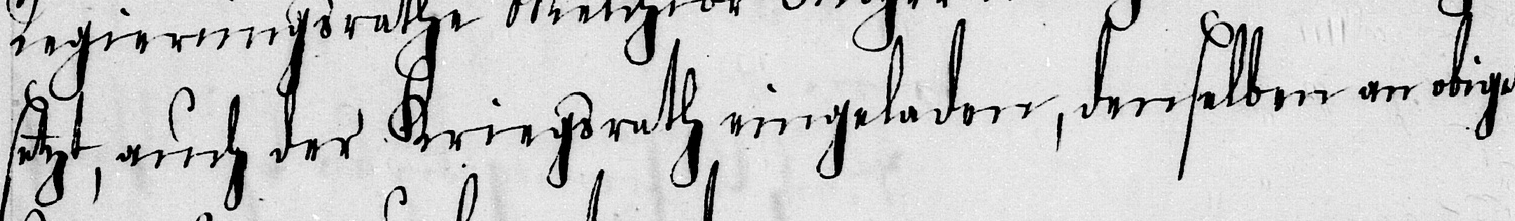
etzt, auch der Kriegsrath eingeladen, denselben an obige
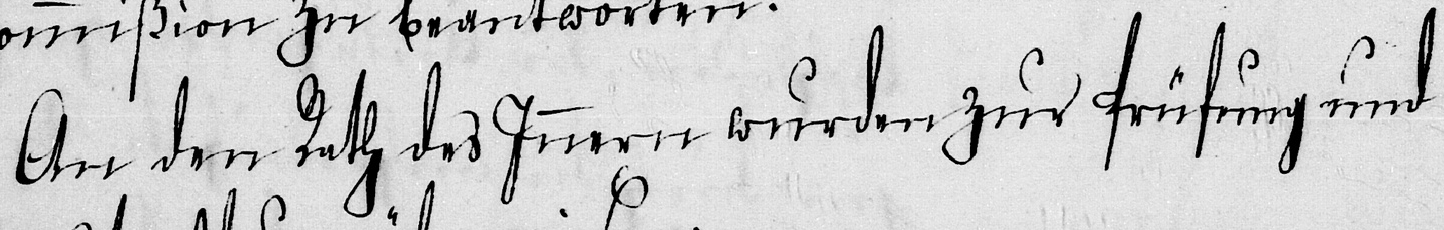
An den Rath des Innern wurden zu Prüfung und
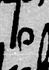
s.
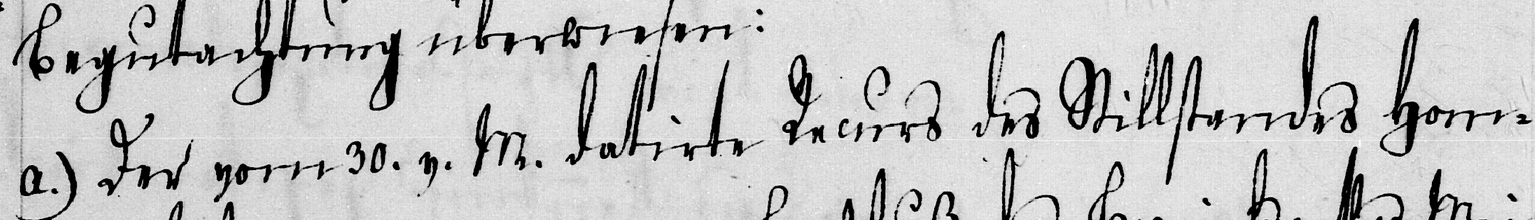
a.) Der vom 3. v. M. datirte Recurs des Stillstandes Hom¬
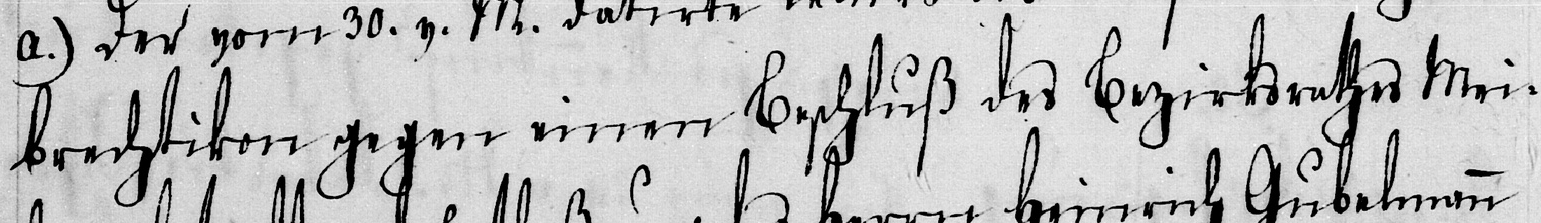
brechtikon gegen einen Beschluß des Bezirksrathes Mei¬
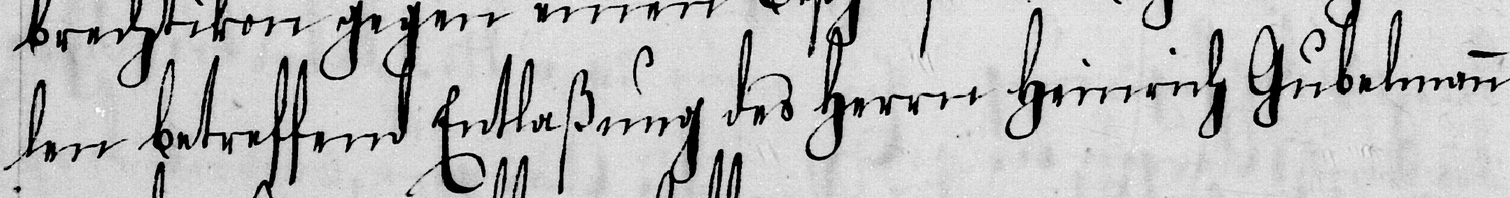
len betreffend Entlaßung des Herrn Heinrich Gubelmann
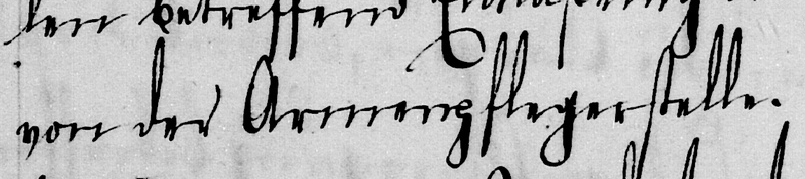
von der Armenpflegerstelle.
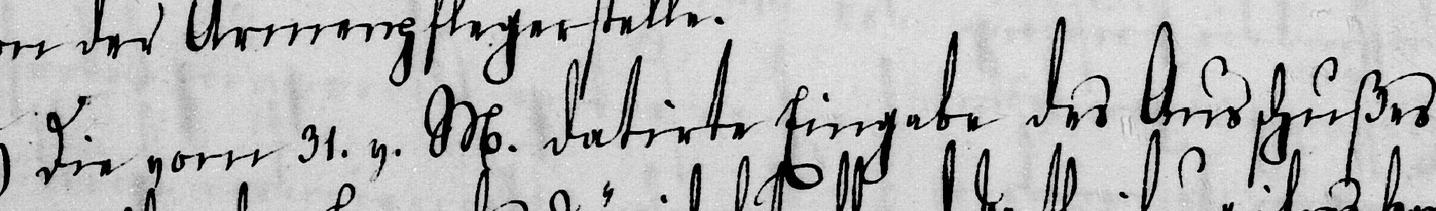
Die vom 31. v. M. datirte Eingabe des Ausschußes
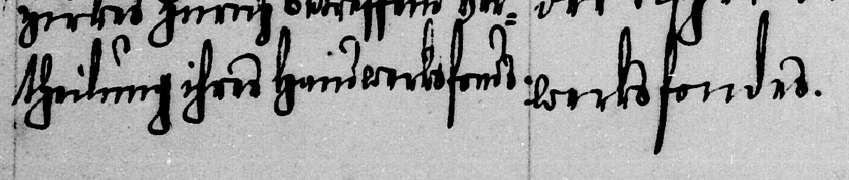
theilung ihres Handwerksfonds.
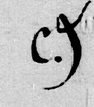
b.)
